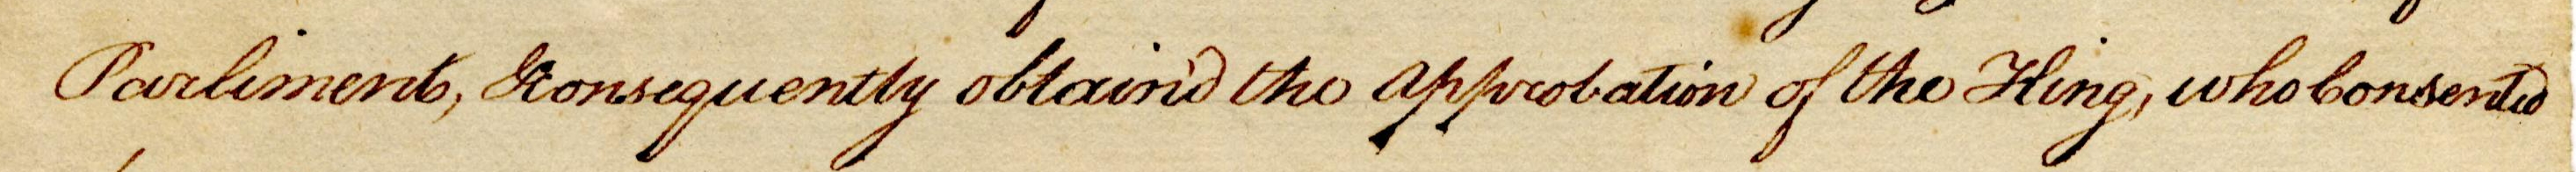Parliament, & consequently obtain'd the approbation of the King, who consented
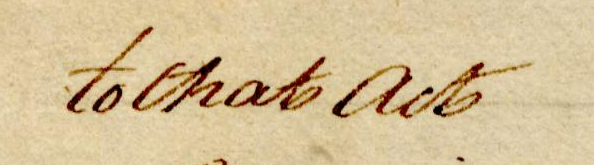to that Act
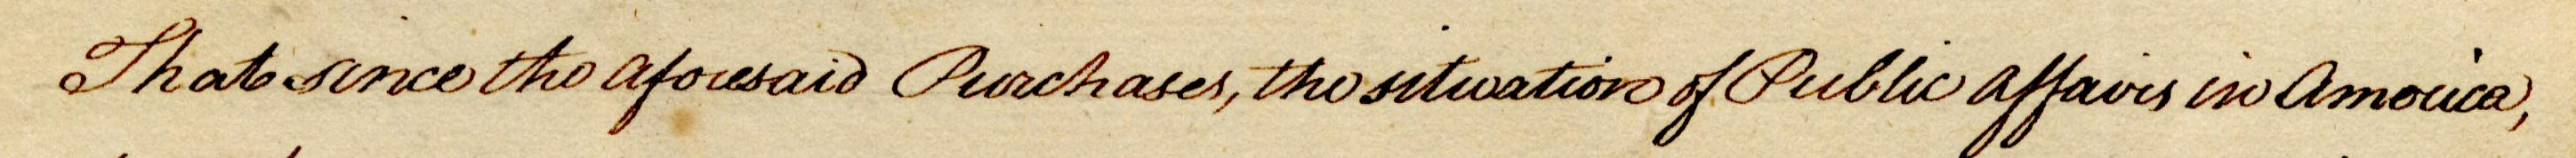That since the aforesaid Purchases, the situation of Public affairs in America,
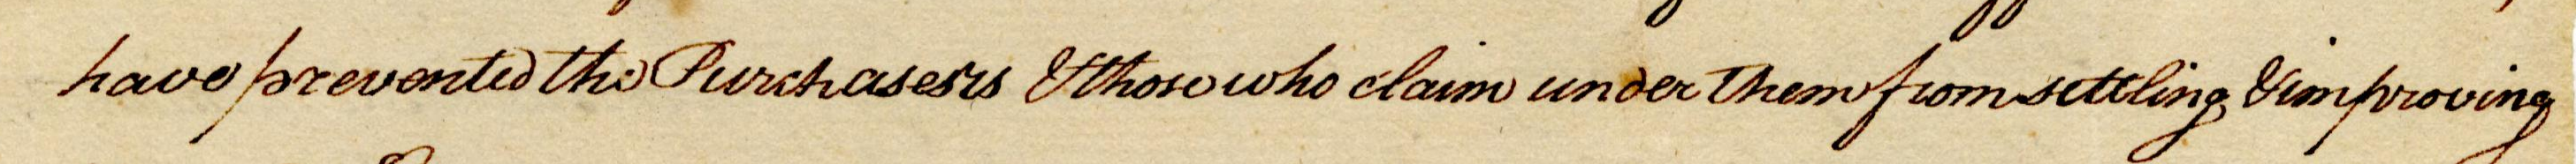have prevented the Purchasers & those who claim under them from settling & improving
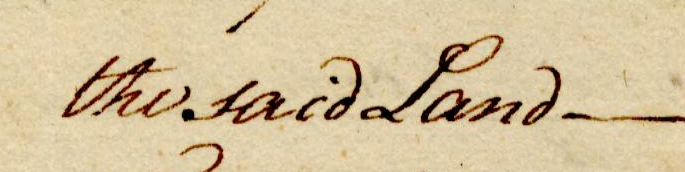the said Land-
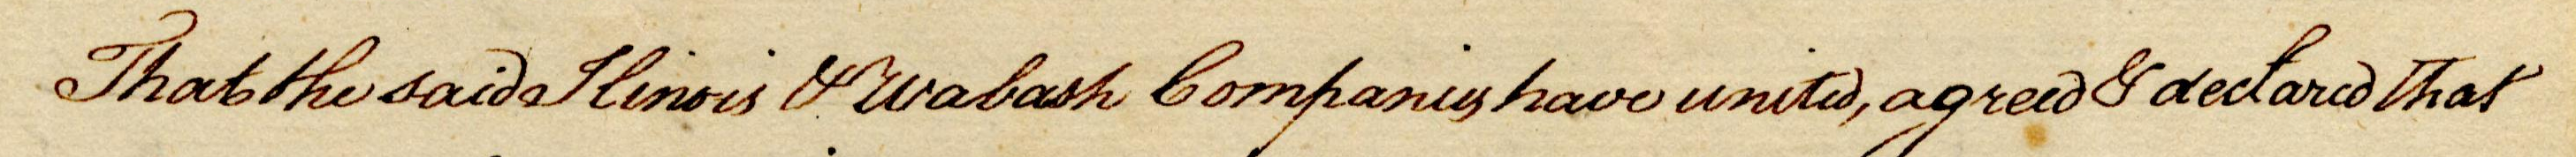That the said Ilinois & Wabash Companies have united, agreed & declared that
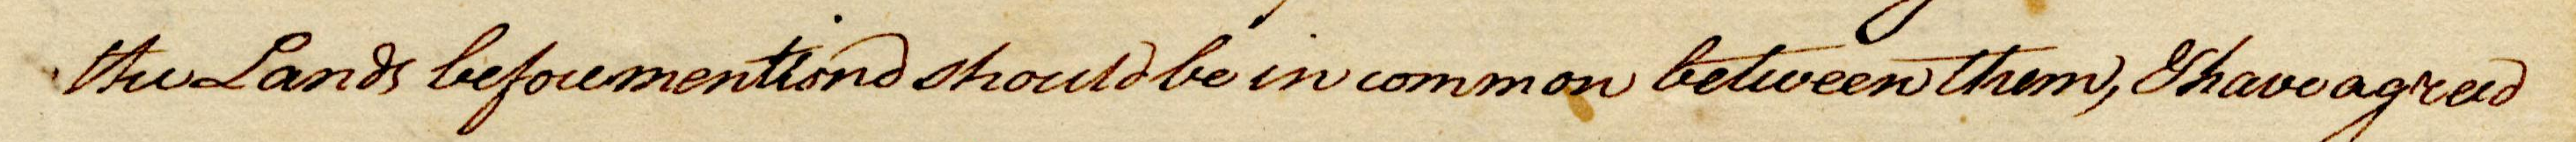the Lands before mentiond should be in common between them, & have agreed
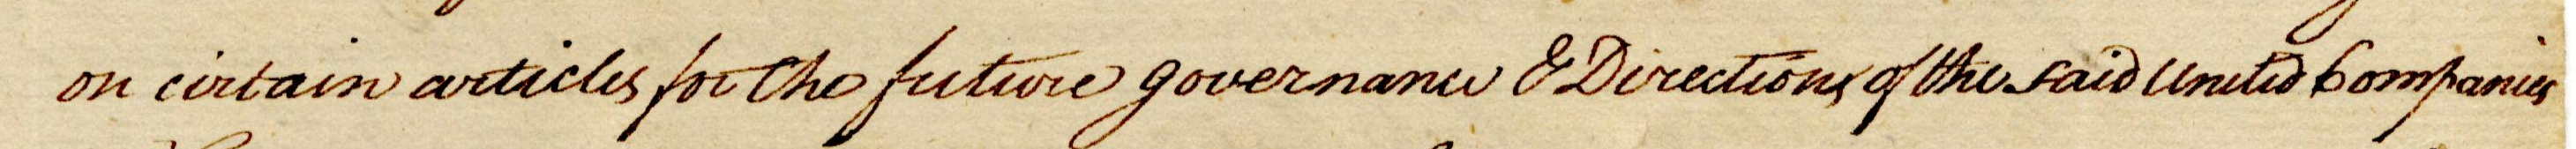on cirtain articles for the future governance & Directions of the said united Companies
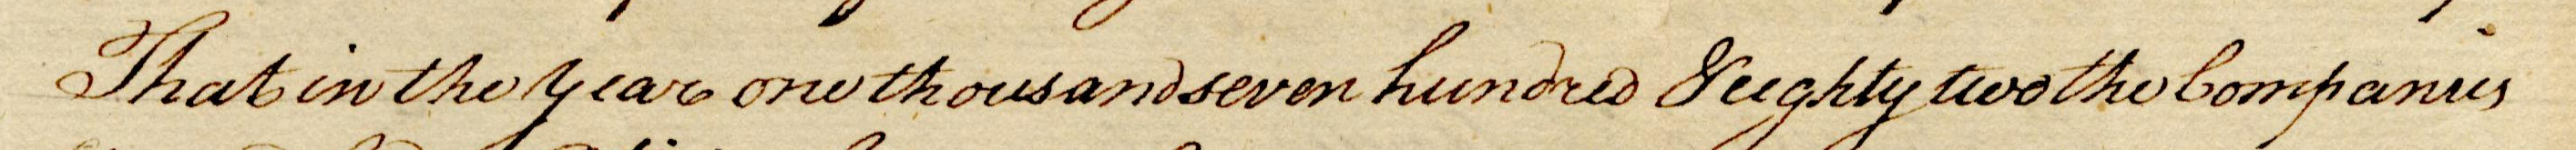That in the year one thousand seven hundred & eighty two the Companies
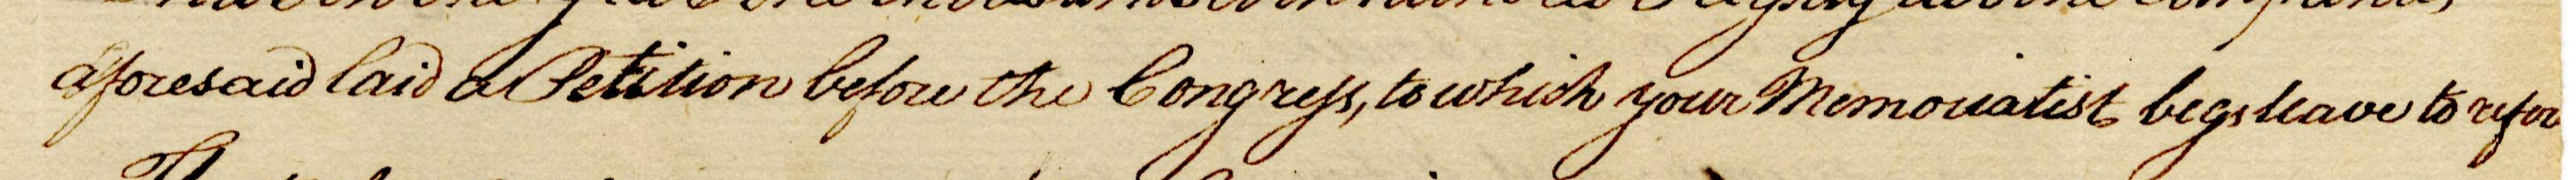aforesaid laid a Petition before the Congress, to which your Memorialist begs leave to you
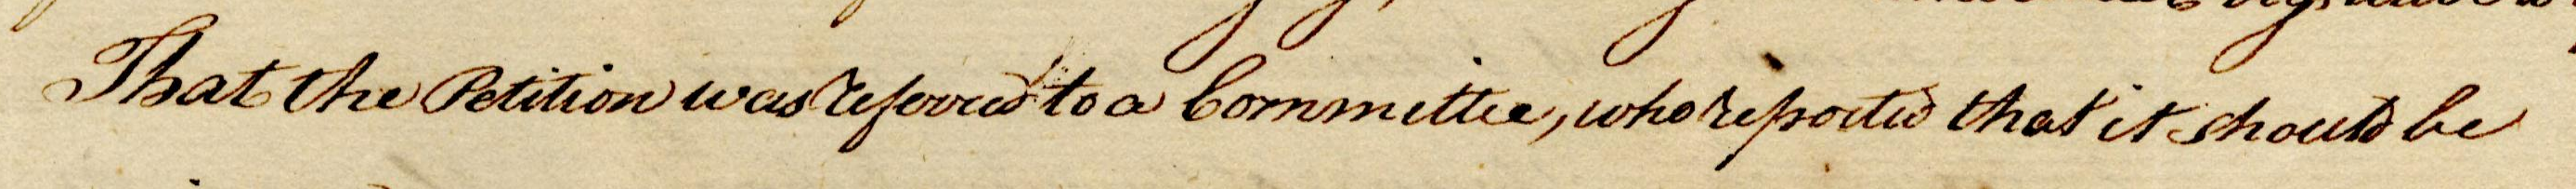That the Petition was referred to a Committee, who reported that it should be
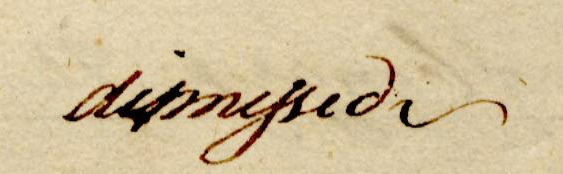dismissed-
